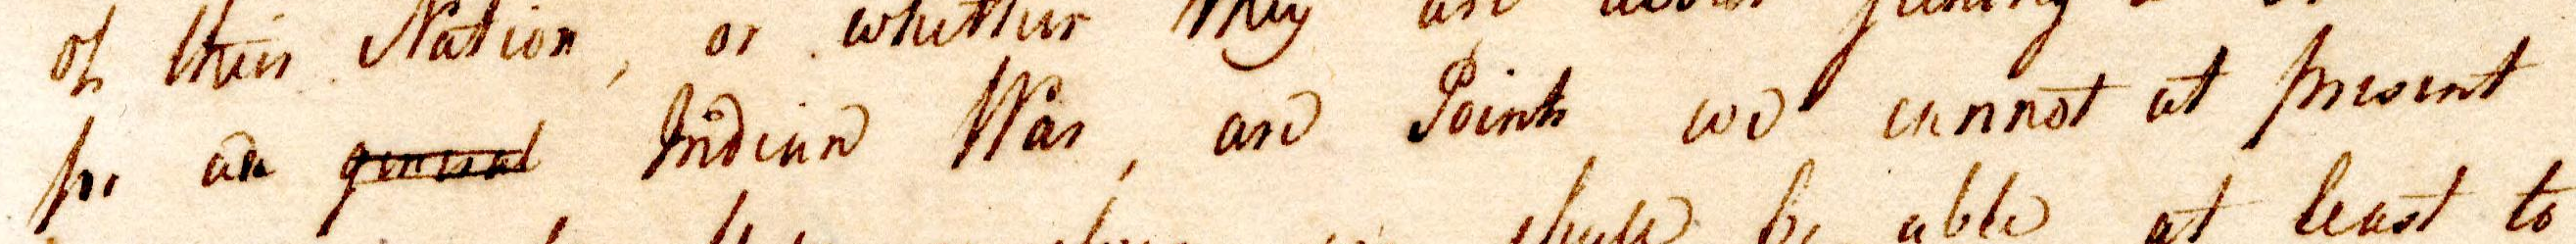for an general Indian War, are Points we cannot at present
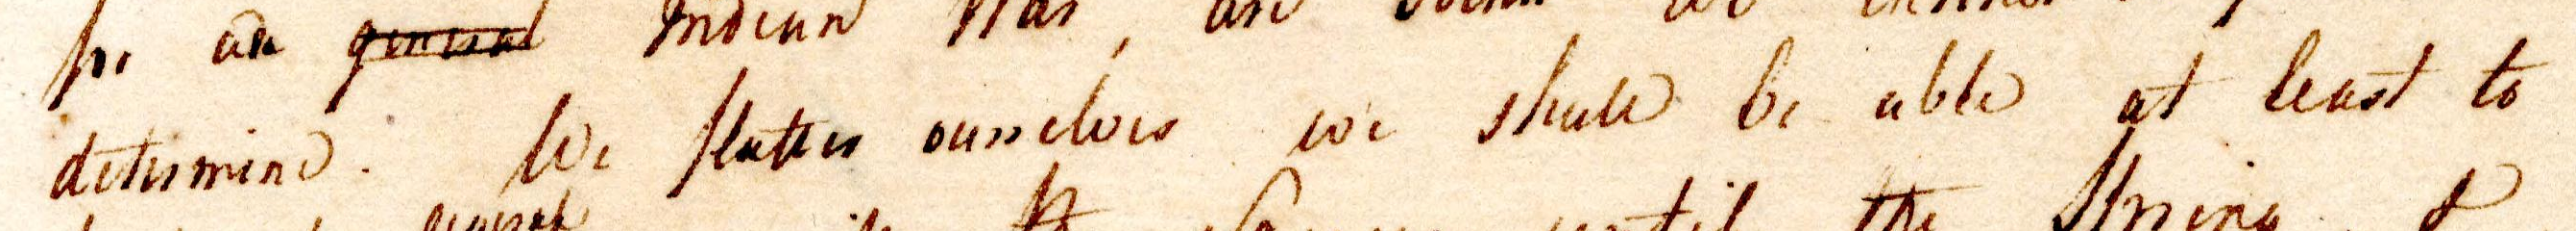determine. We flatter ourselves we shall be able at least to
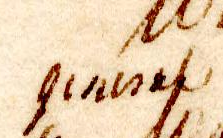general
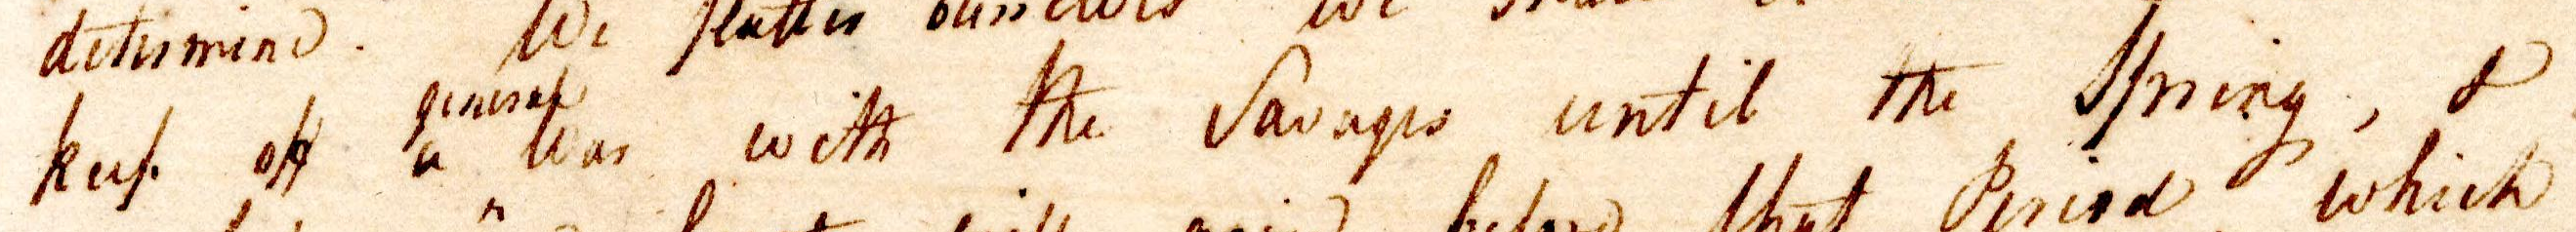keep off a ^ War with the Savages until the Spring, &
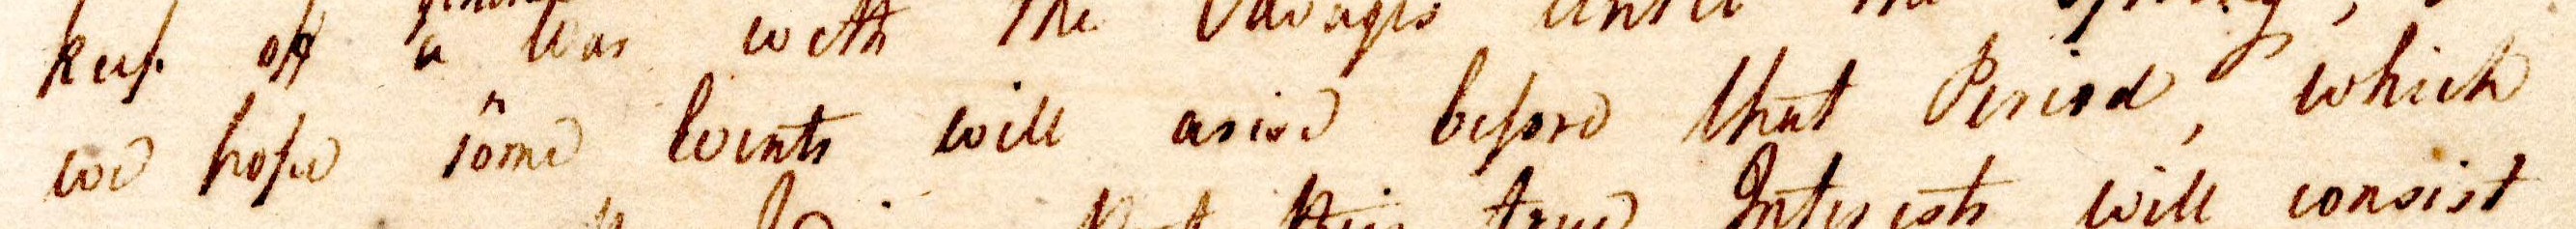we hope some Events will arise before that Period, which
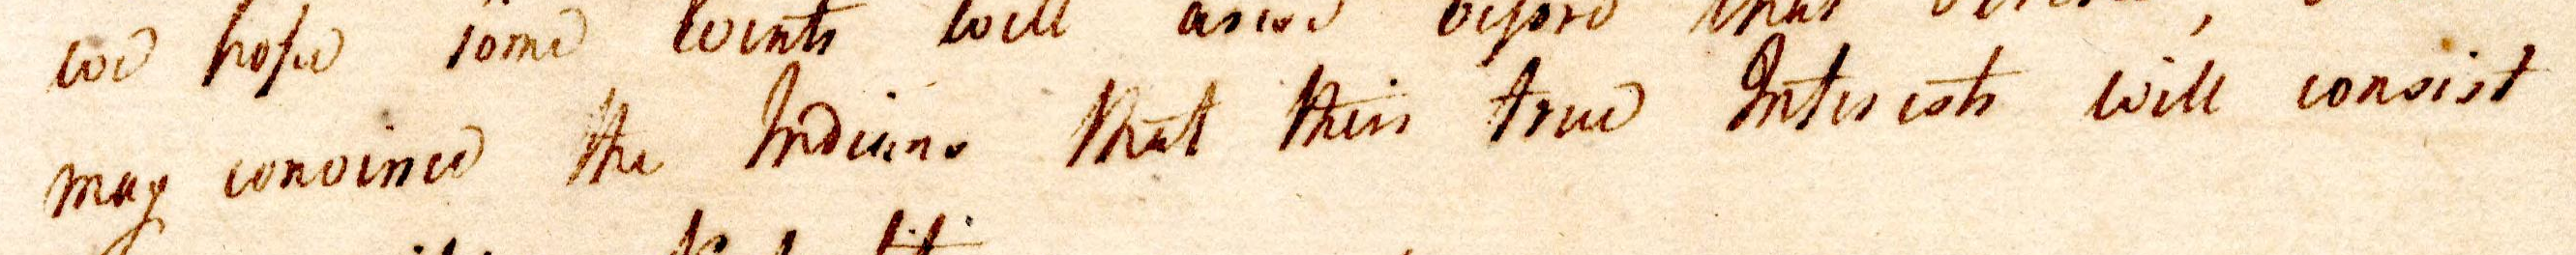may convince the Indians that their true Interests will consist
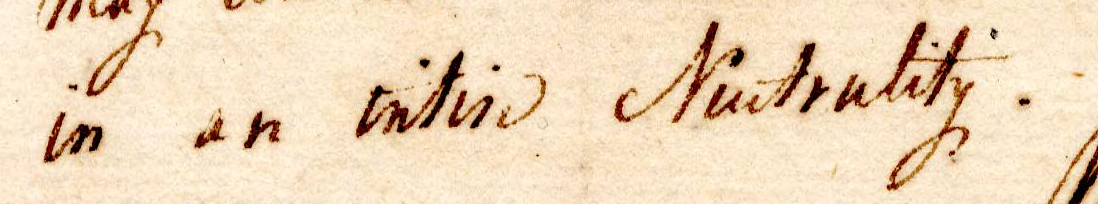in an entire Neutrality.
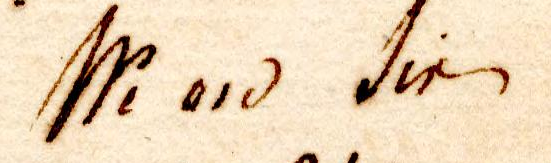We are Sir
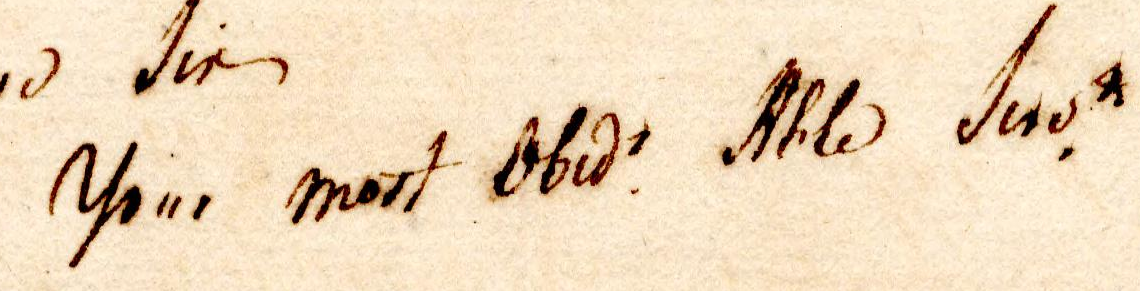Your most Obed^t Hble Serv^t.
